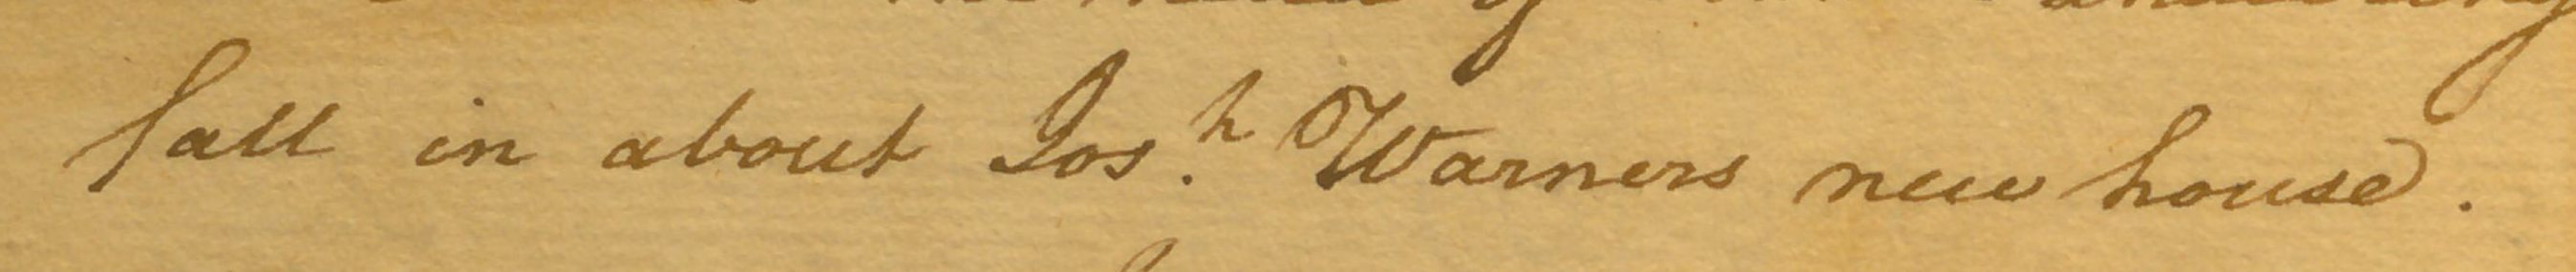fall in about Jos^h. Warners new house.
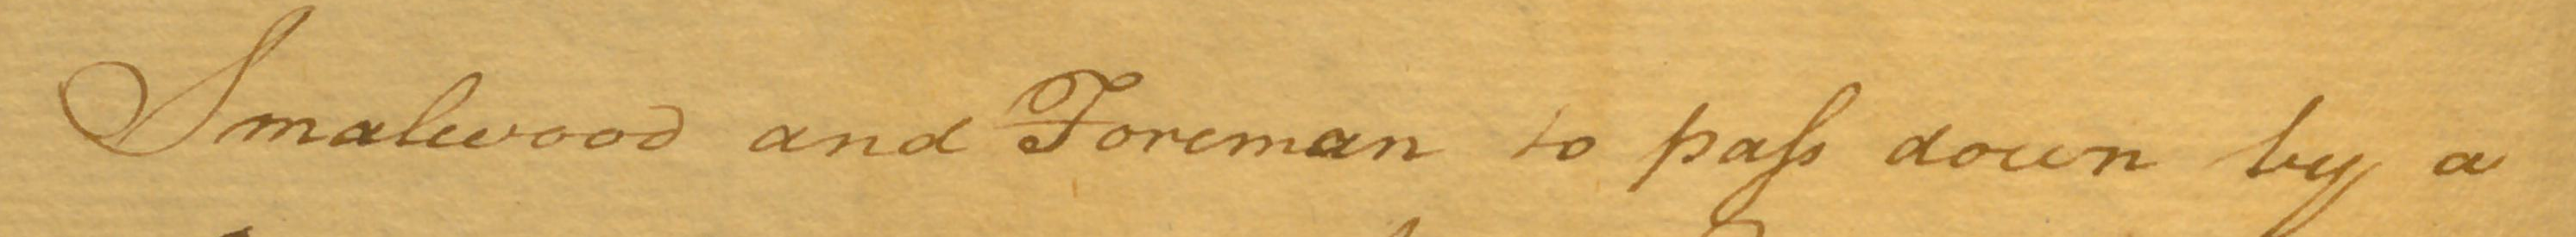Smalwood and Foreman to pass down by a
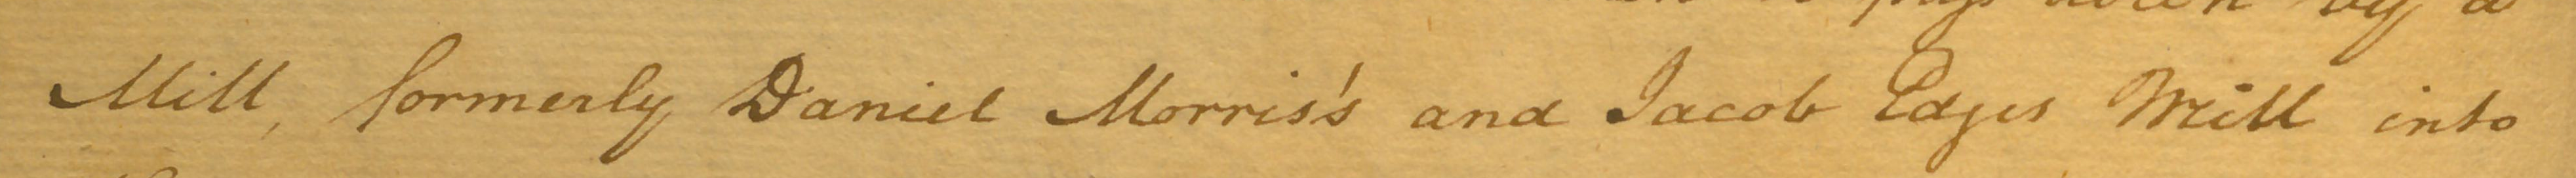Mill formerly Daniel Morris's and Jacob Pages Mill into
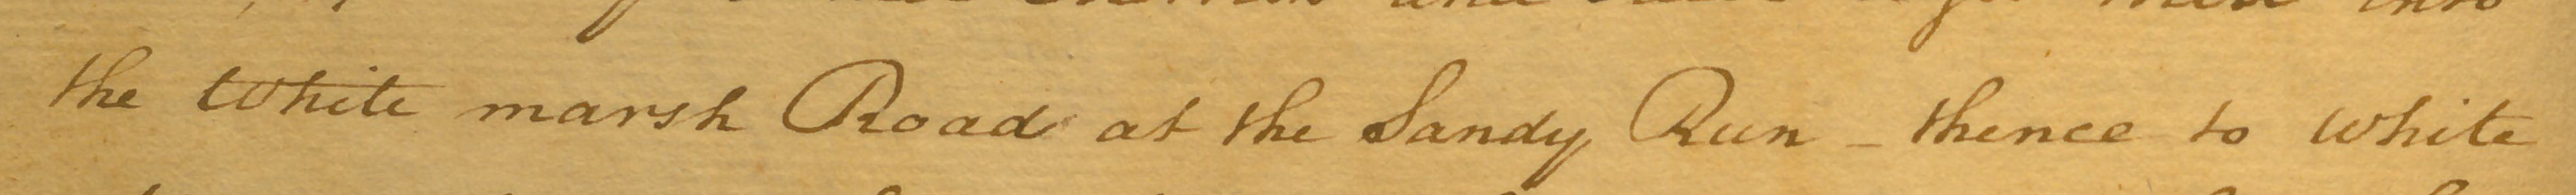the White marsh Road at the Sandy Run- thence to White
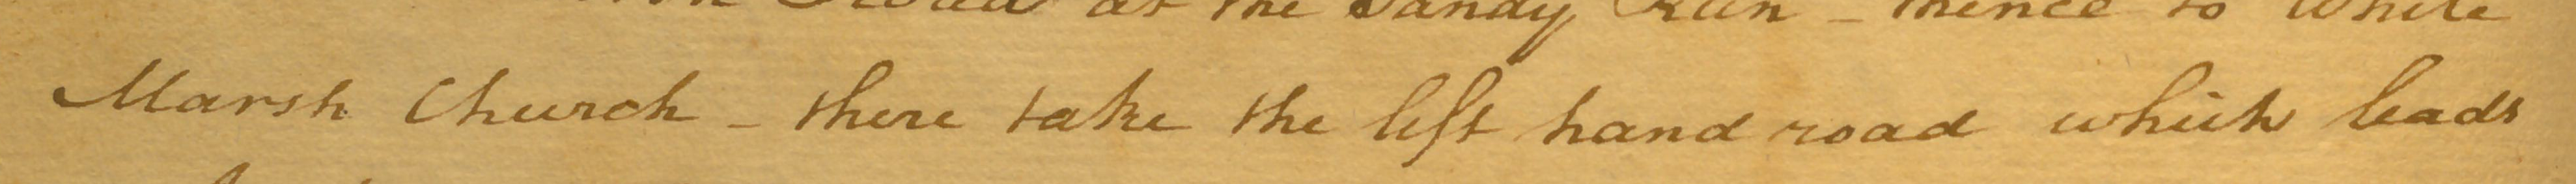Marsh Church- there take the left hand road which leads
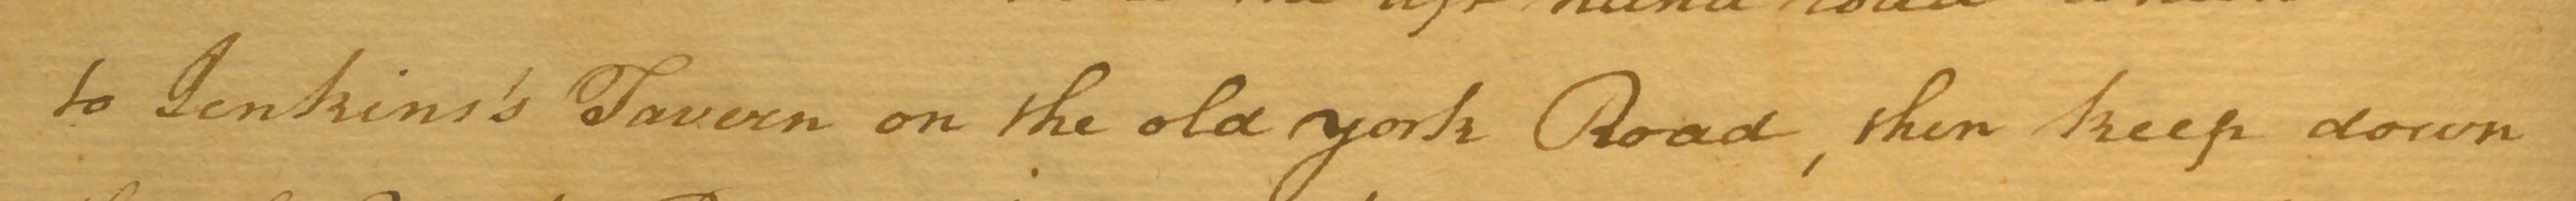to Jenkins's Tavern on the old york Road, then keep down
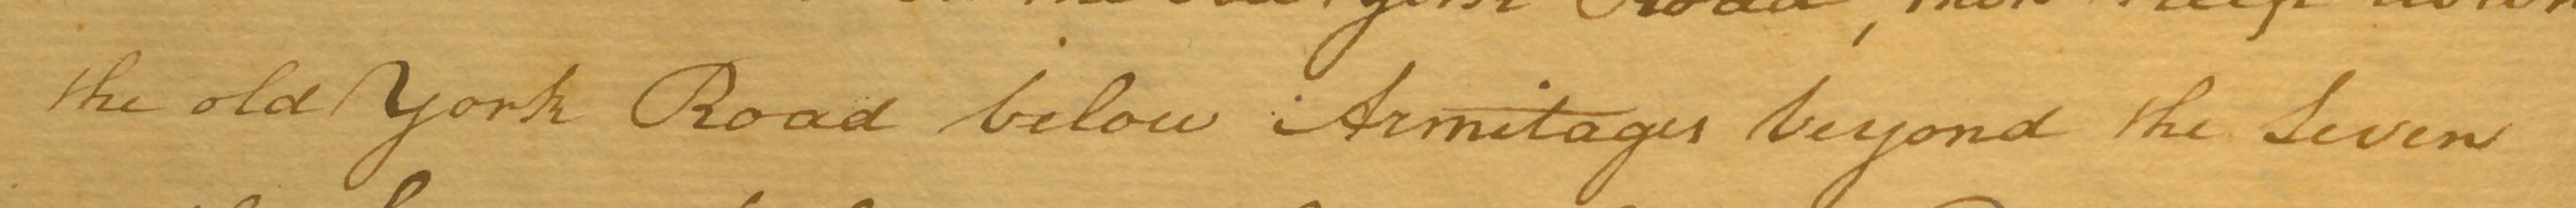the old York Road below Armitages beyond the Seven
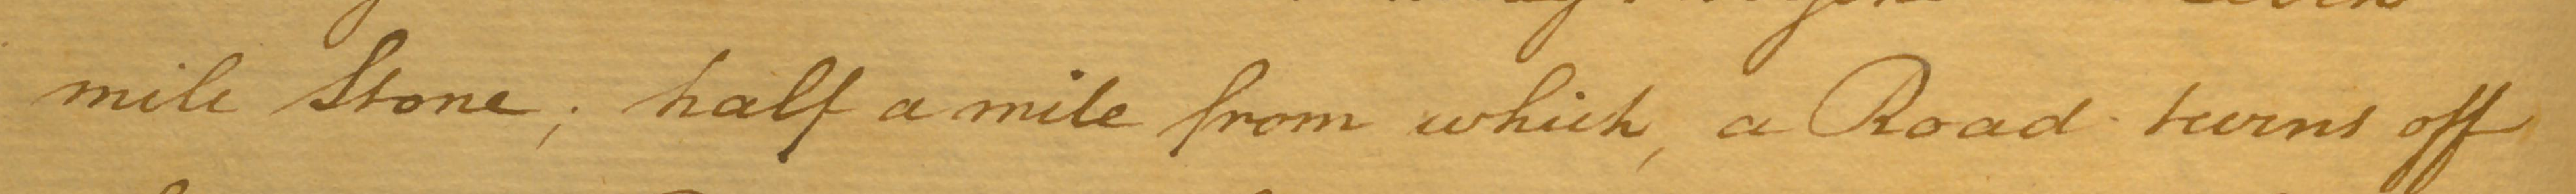mill Stone; half a mile from which a Road turns off
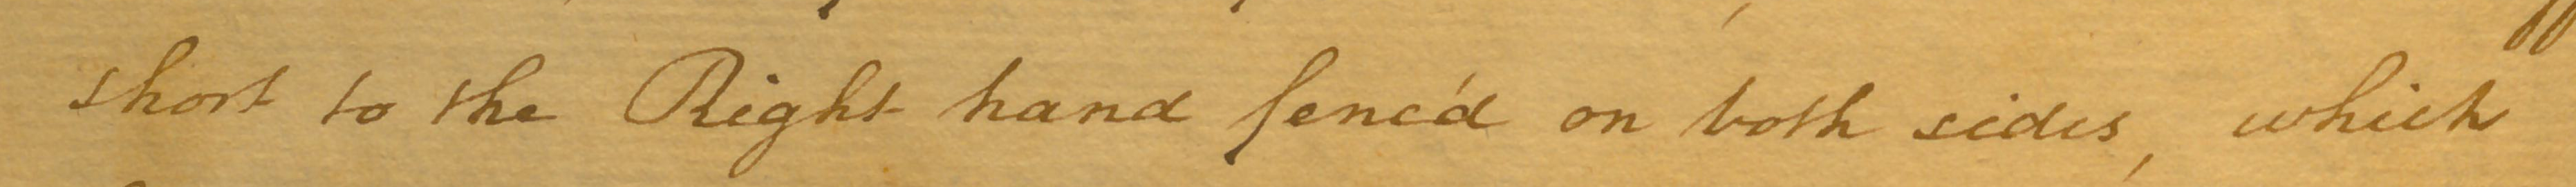short to the Right hand fenc'd on both sides, which
